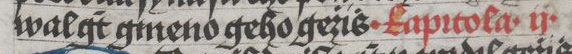wal ḡt gmeno geho geżíṡ.Kapitola. ii.
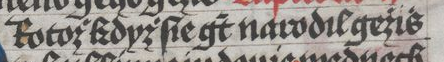Rotož kdyż ſie ḡt narodil geżiṡ
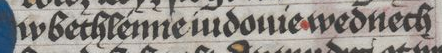w bethlémie iudoníe.wednech
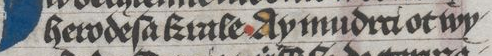herodeſa krale.Ay mudrci ot wy¬
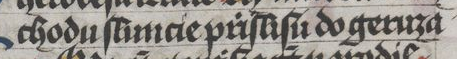chodu ſluncie pṙiẛli ſú do geruza¬
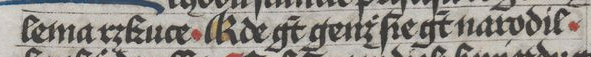lema rzkuce.Kde ḡt genż ſie ḡt narodil.
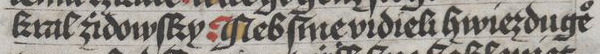kral żidowſky?Neb ſme vidieli hwíezdu geo
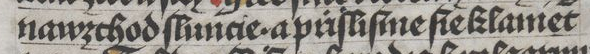nawzchod ſluncie.a pṙiẛli ſme ſie klaníet
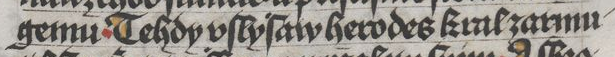gemu.Tehdy vſlyẛaw herodes kral zarmu¬
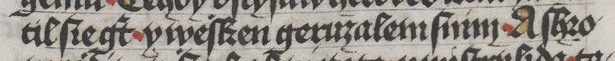til ſie ḡt.y weẛken geruzalem ſnim.A ſhro¬
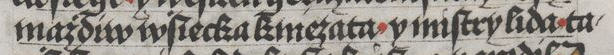mażdíw wẛiecka kníezata.y miſtry lida.ta¬
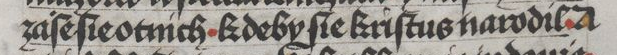zaẛe ſie otnich.kdeby ſie kriſtus narodíl.A
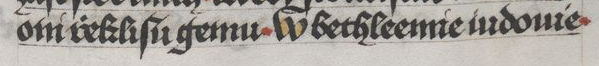oni ṙekli ſu gemu.W bethleemie iudouíe.
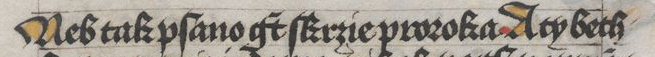Neb tak pſano ḡt ſkrzie proroka.A ty beth¬
